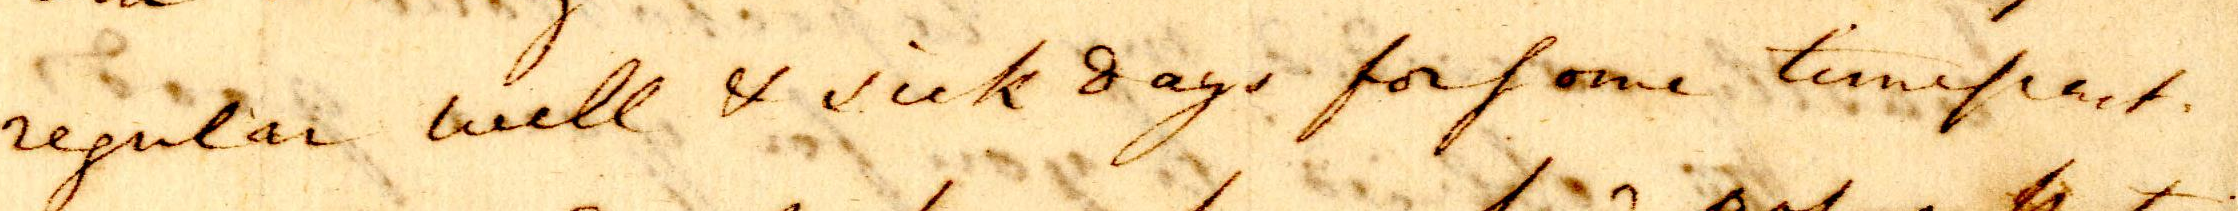regular well & sick days for some time past.
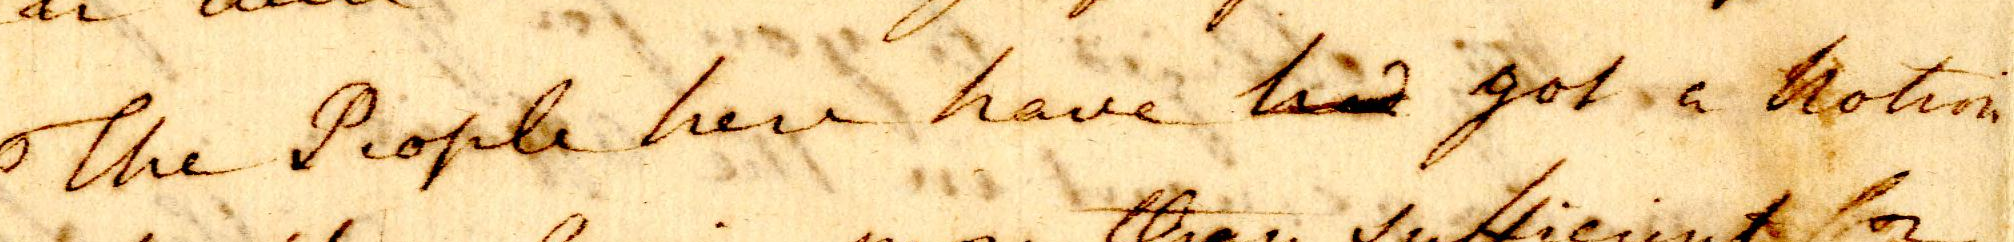The People here have had got a Notion
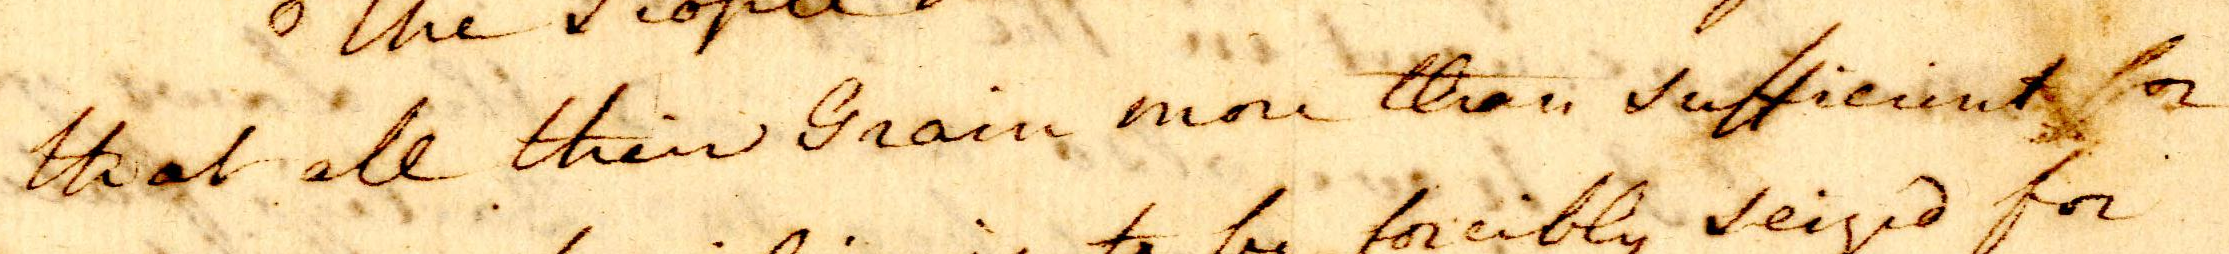that all their Grain more than sufficient for
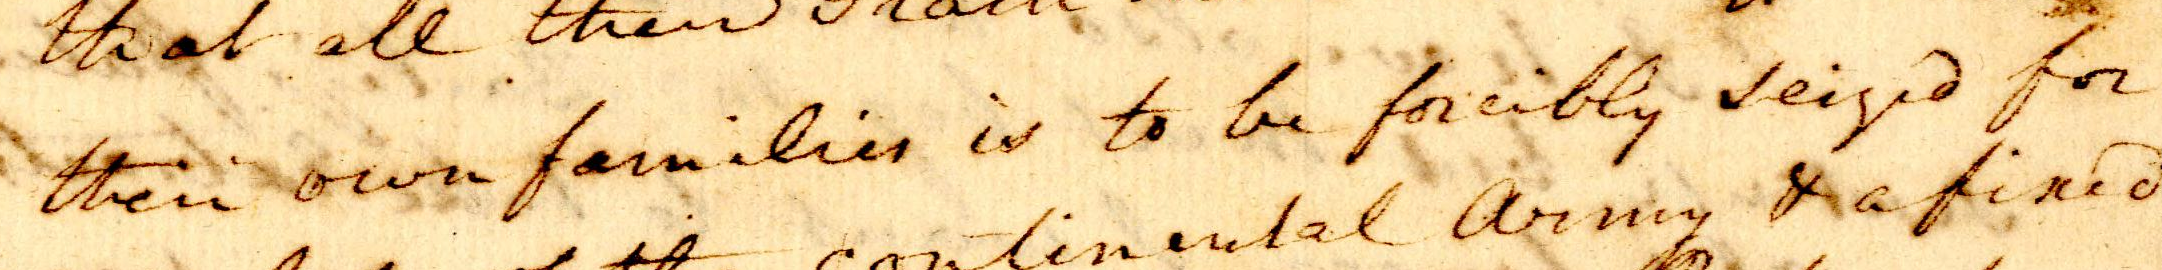their own families is to be forcibly seized for
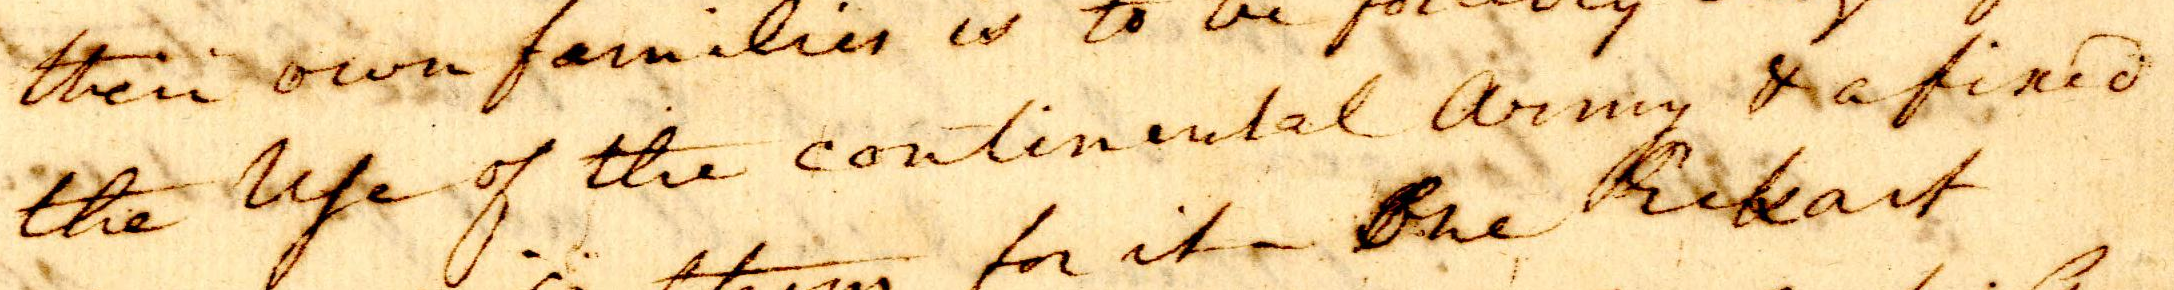the rise of the continental Army & a fixed
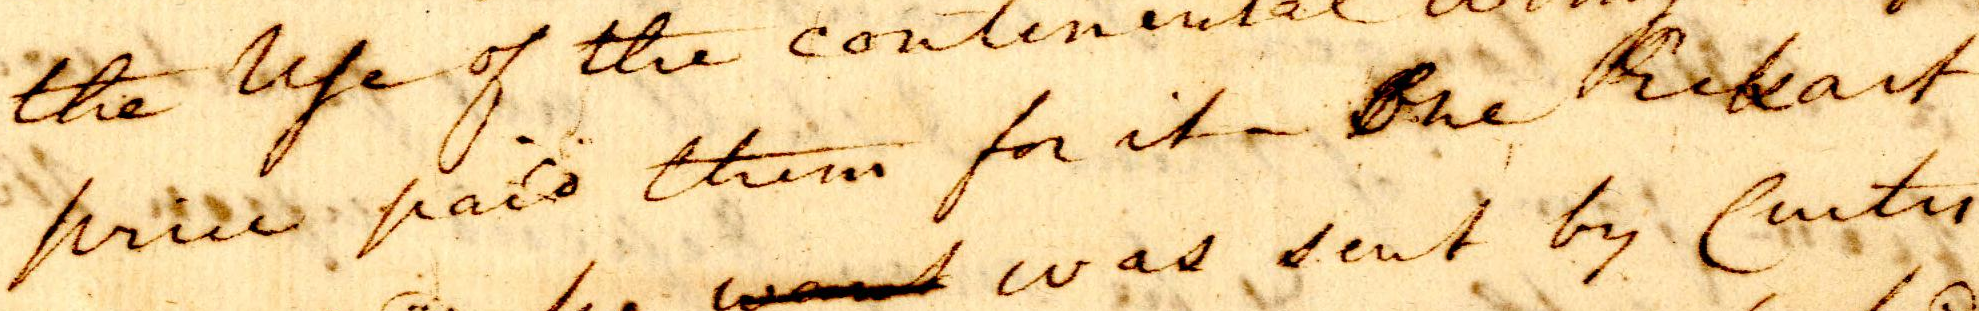price paid them for it- The Rebart
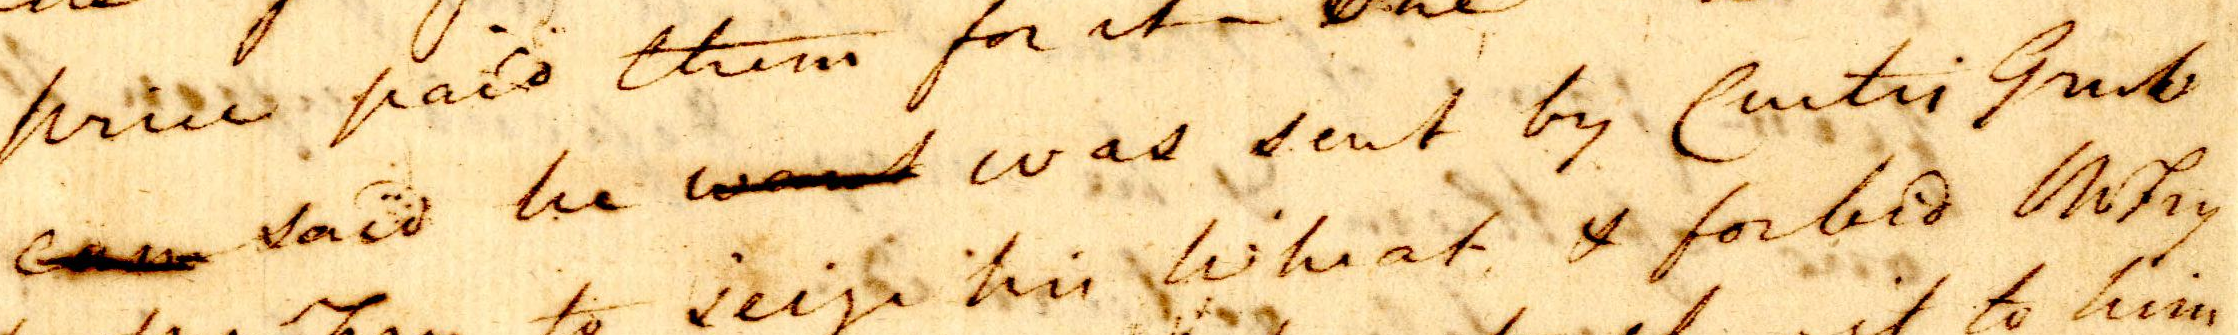can said he [____]was sent by Curtis Grant
